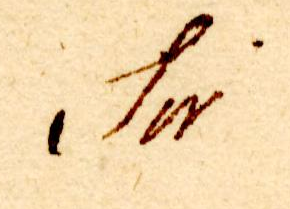Sir
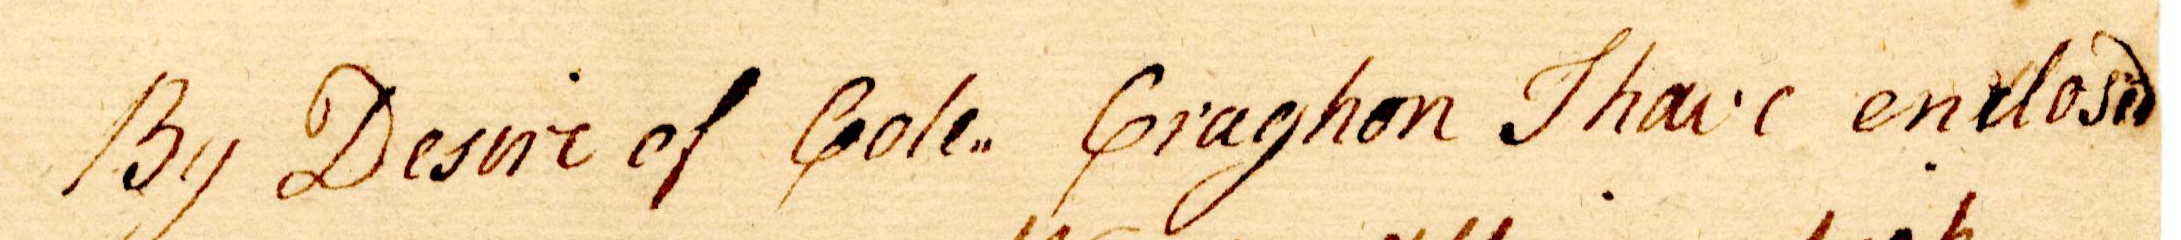By Desire of Colo. Craghon I have enclosed
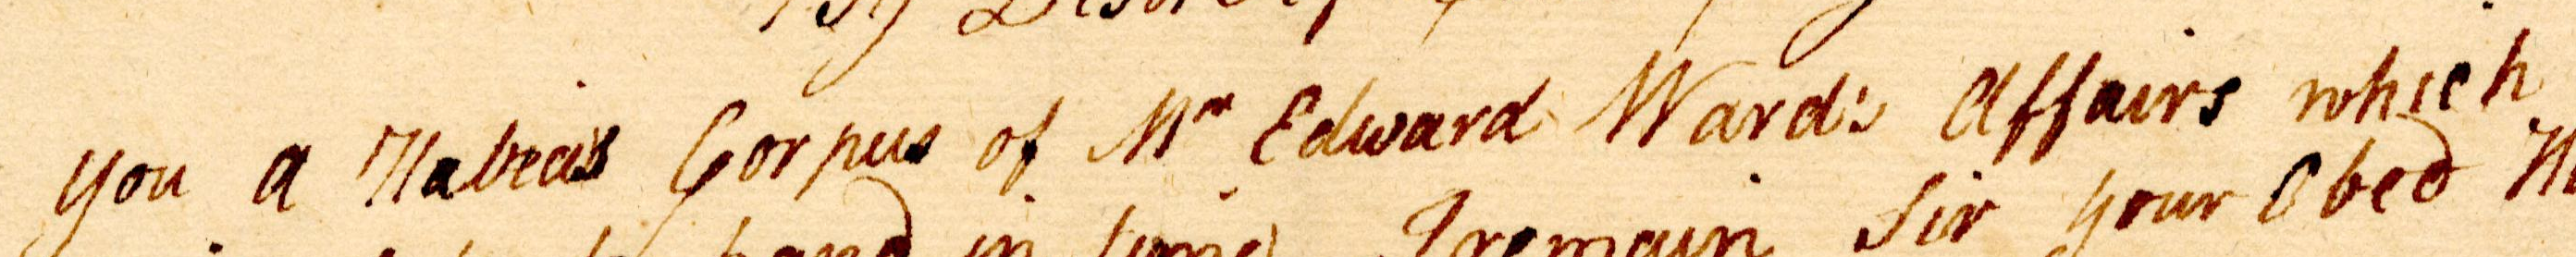you a Habeas Corpus of M^r. Edward Wards affairs which
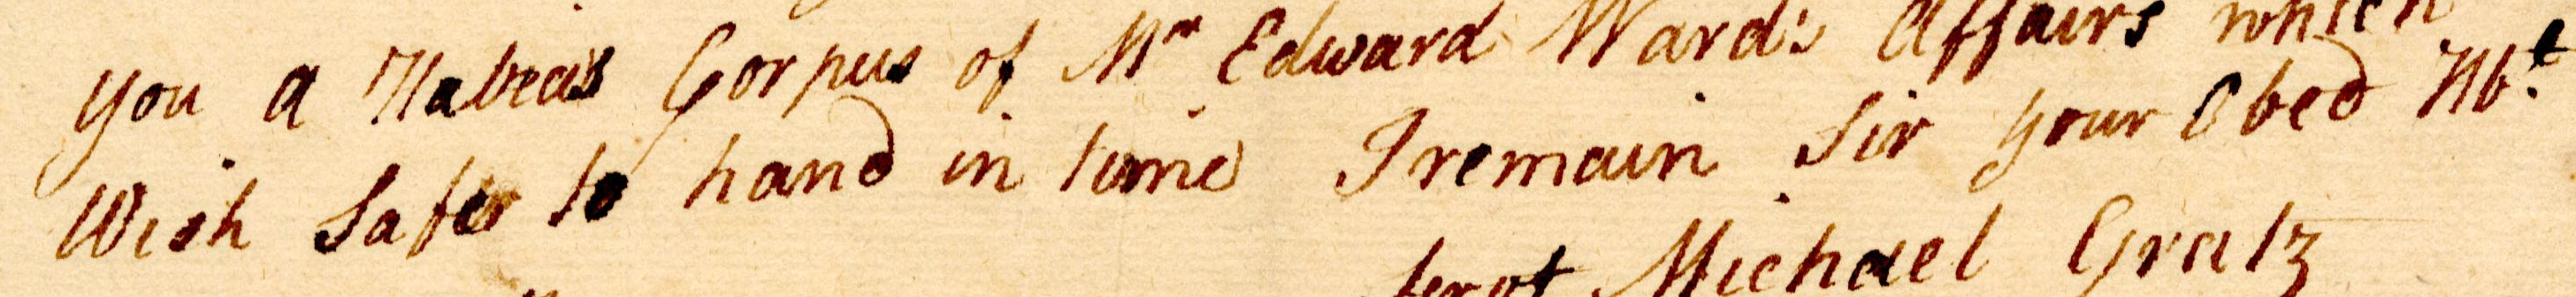Wish safer to hand in time I remain Sir your Obed Hb^l.
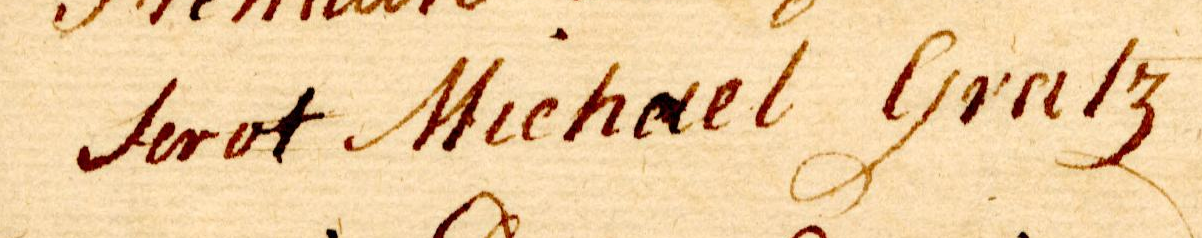servt Michael Gratz
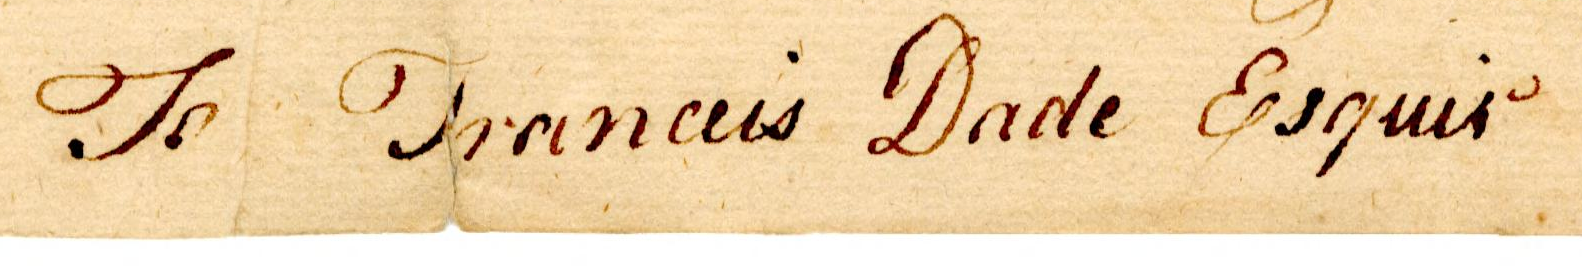To Franceis Dade Esqui
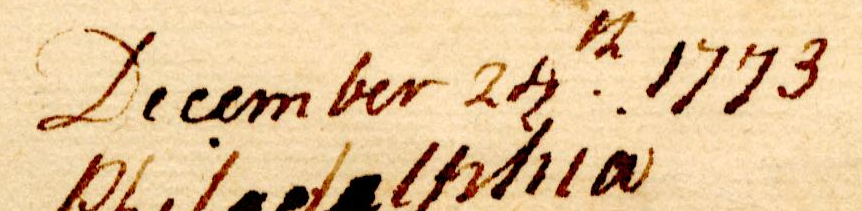December 24^th 1773
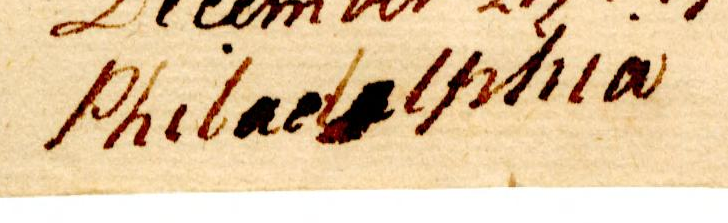Philadelphia
